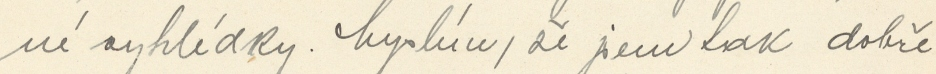né vyhlídky. Myslím, že jsem tak dobře
